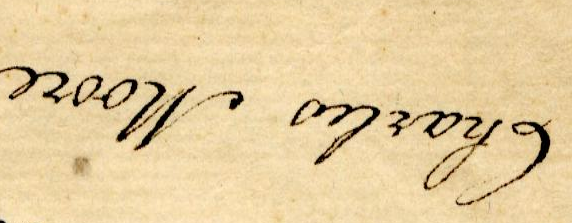Charles Moore
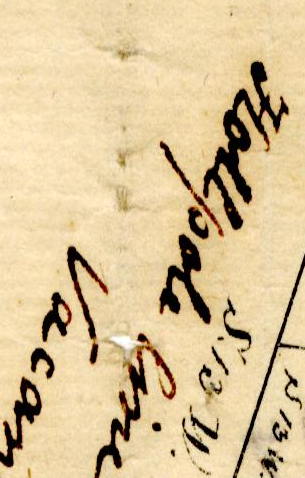Hollpole line
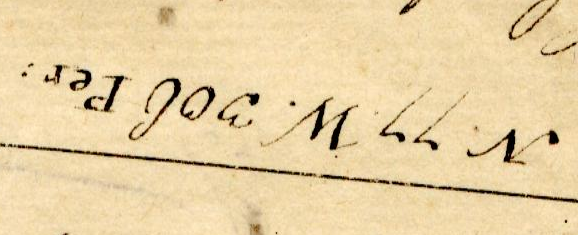N. 77 W. 300 Per:
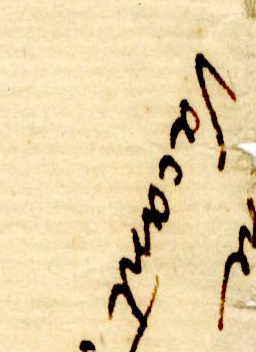Vacant.
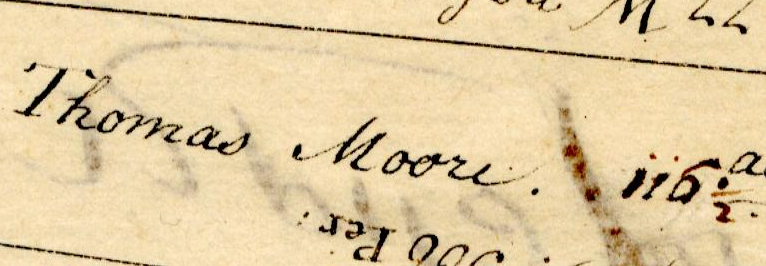Thomas Moore. 116 1/2^ac
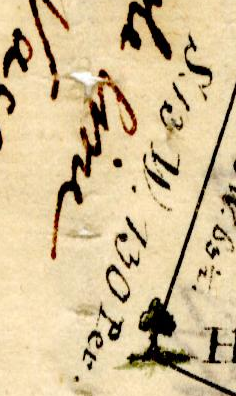S. 13W. 130 Per.
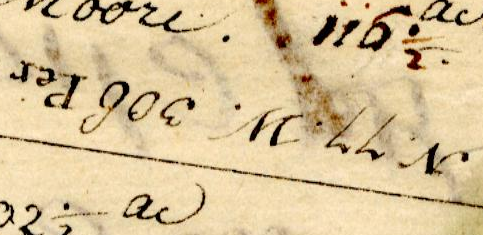N. 77.W. 306 Per:
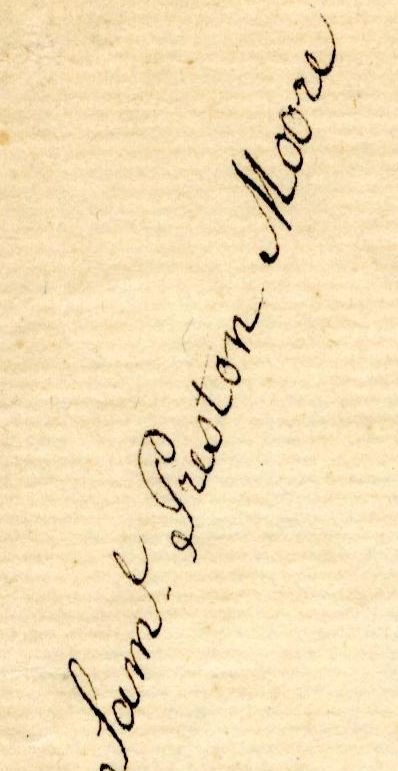Sam^l Preston Moore
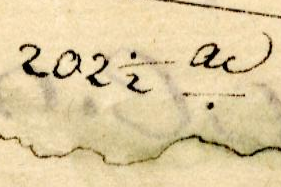202 1/2^ac
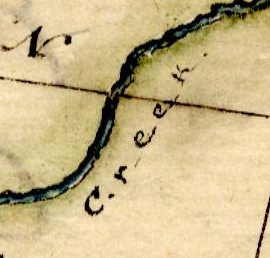Creek
